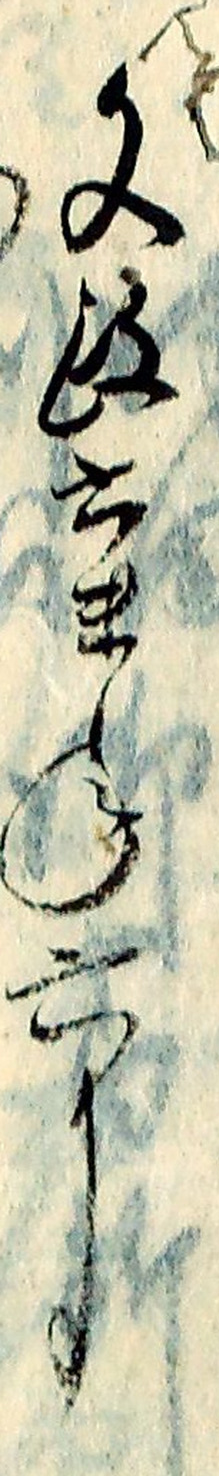文政六未年六月
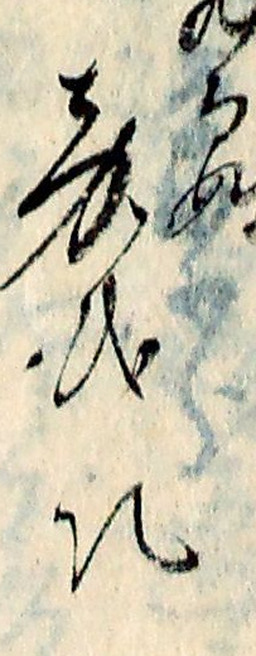嘉代次
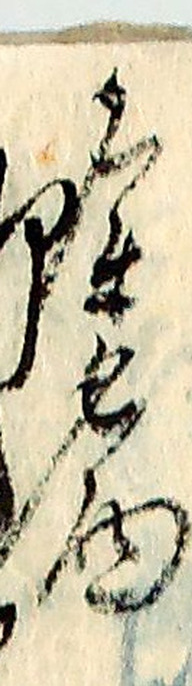名東名西
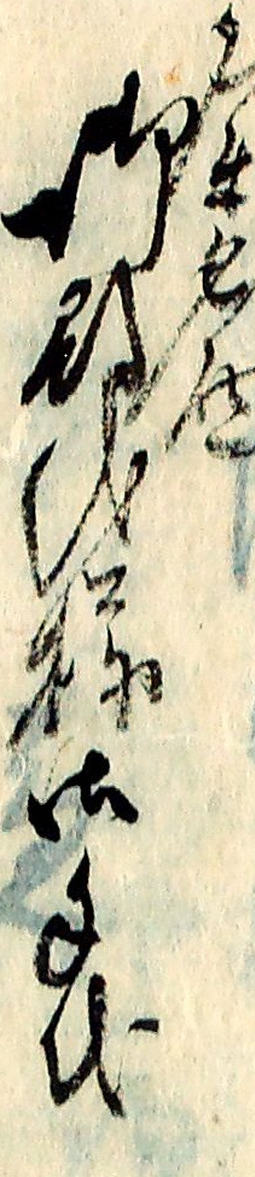御郡代様御手代
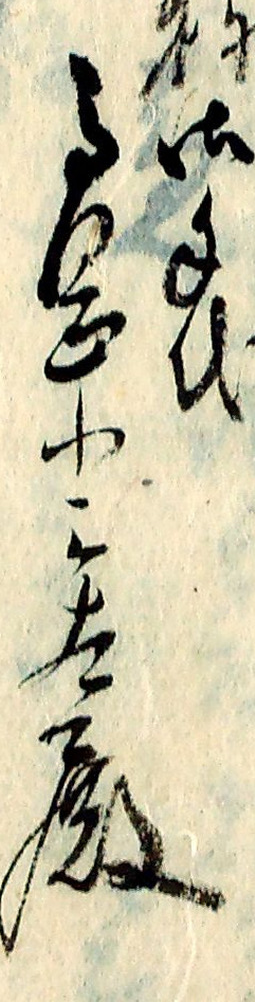高岡小三太殿
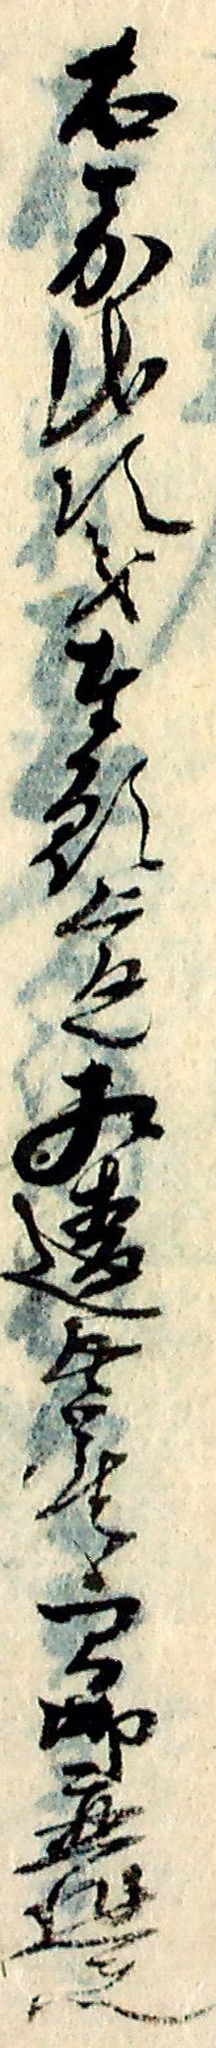右嘉代次義奉願上通相違無御座候間御慈悲を以
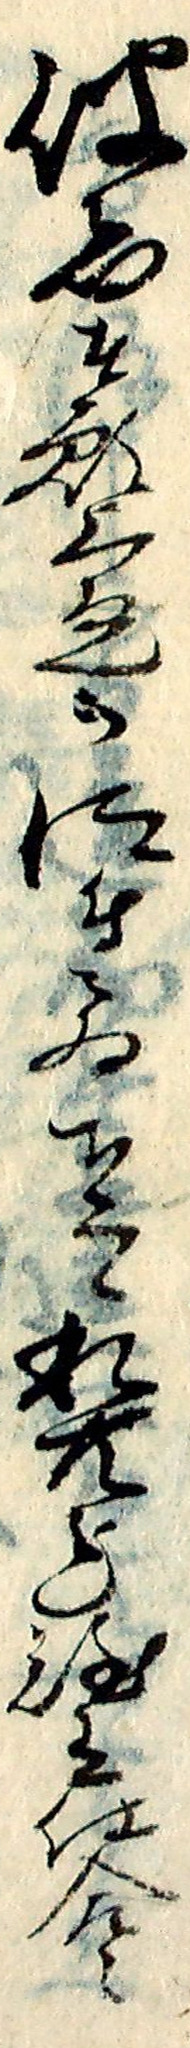彼者奉願上通被仰付被為下候はゝ私共迄難有仕合に
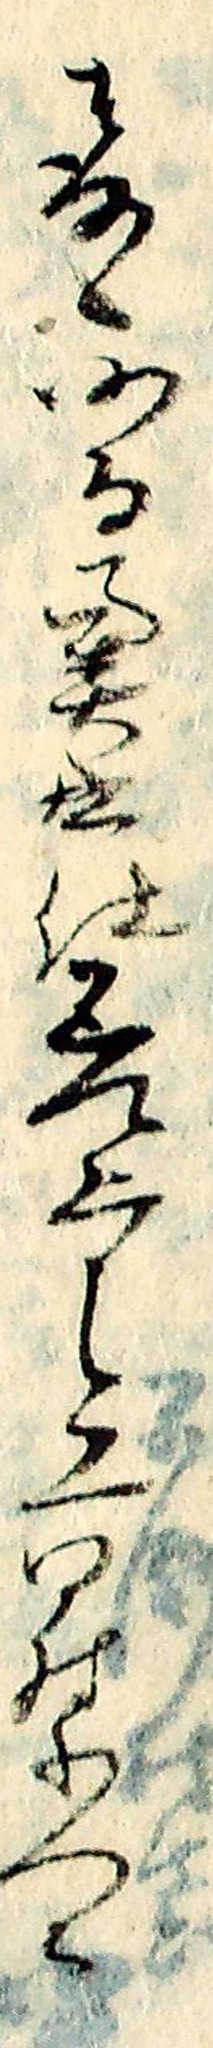奉存候仍て奥書仕差上申候以上同村五人与
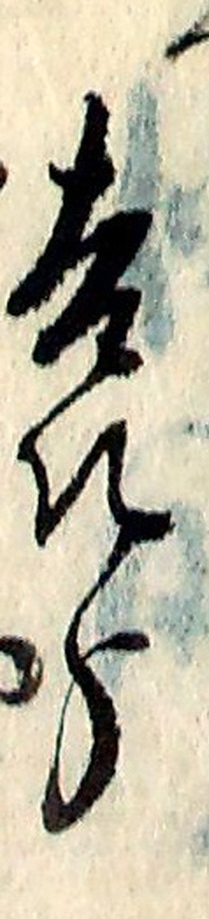吉次郎
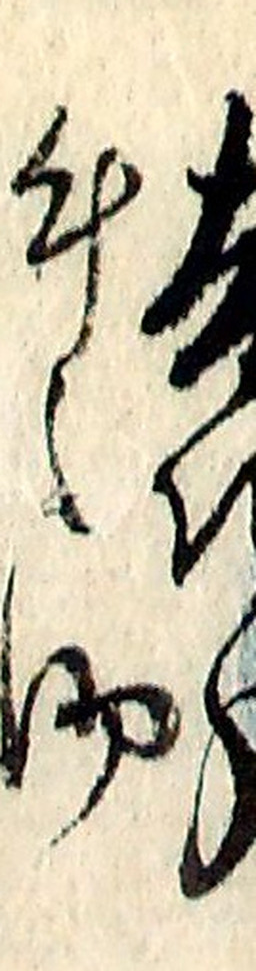牛之助
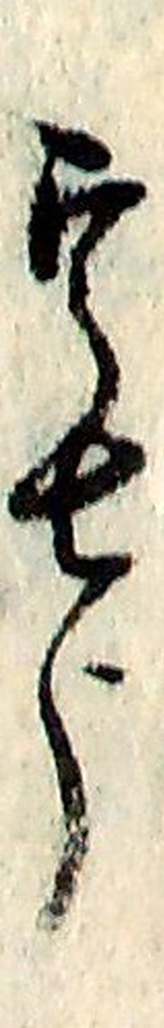宇七郎
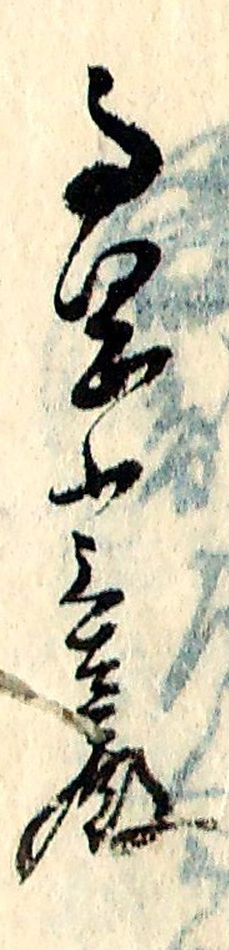高岡小三太殿

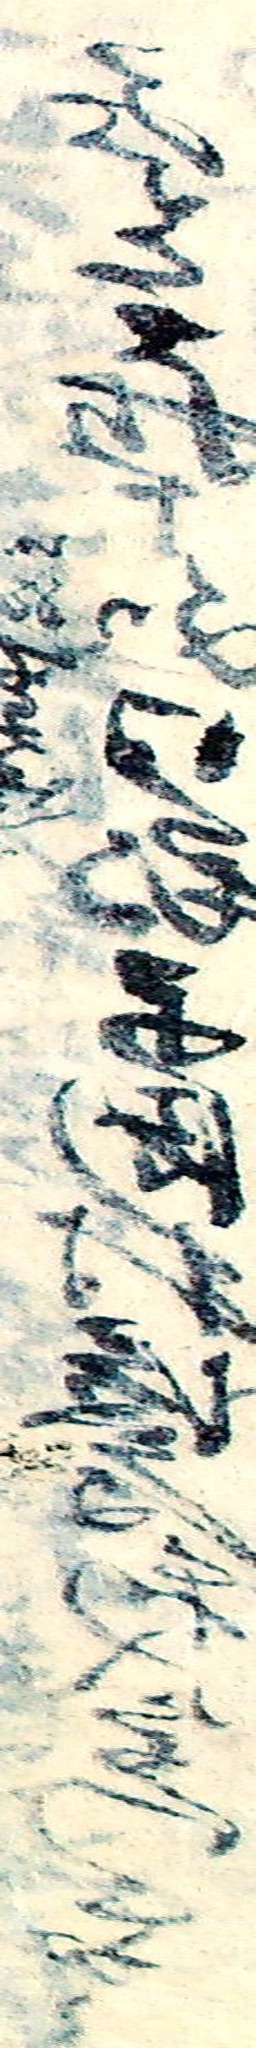未八月十一日
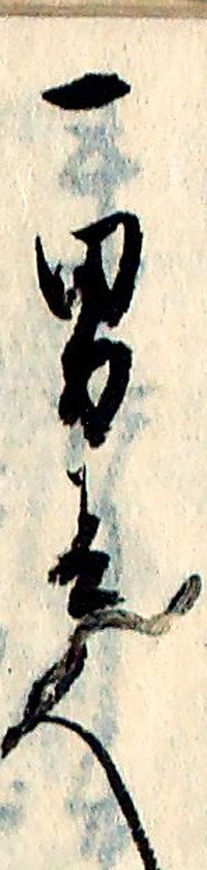一男壱人
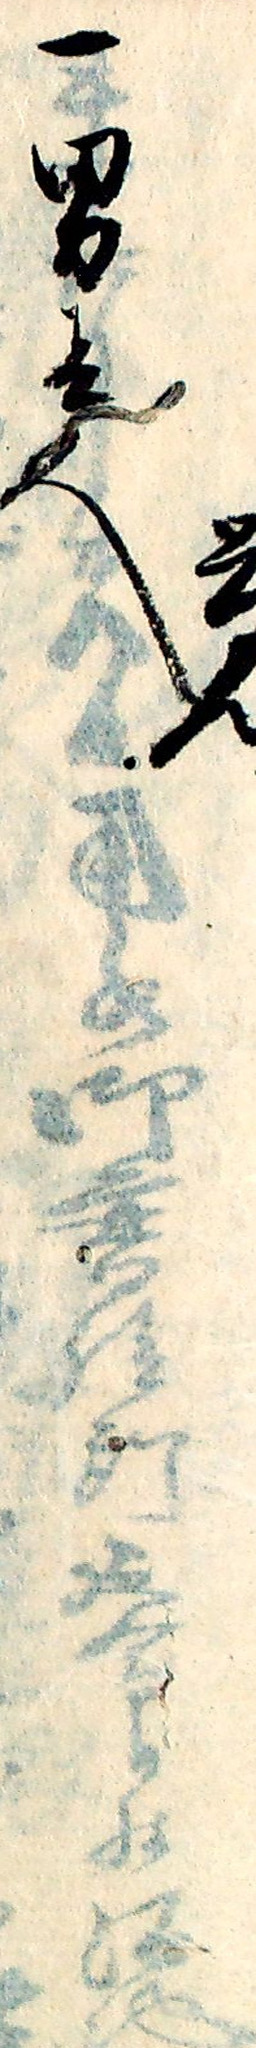一男壱人
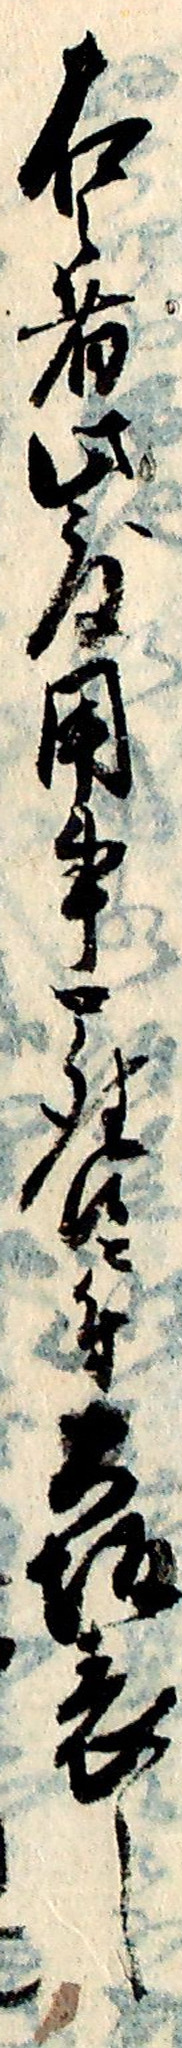右之者此度用事御座候に付大坂表へ
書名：諸御願書控(後藤氏壱番）
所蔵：鳴門教育大学 Naruto University of Education
